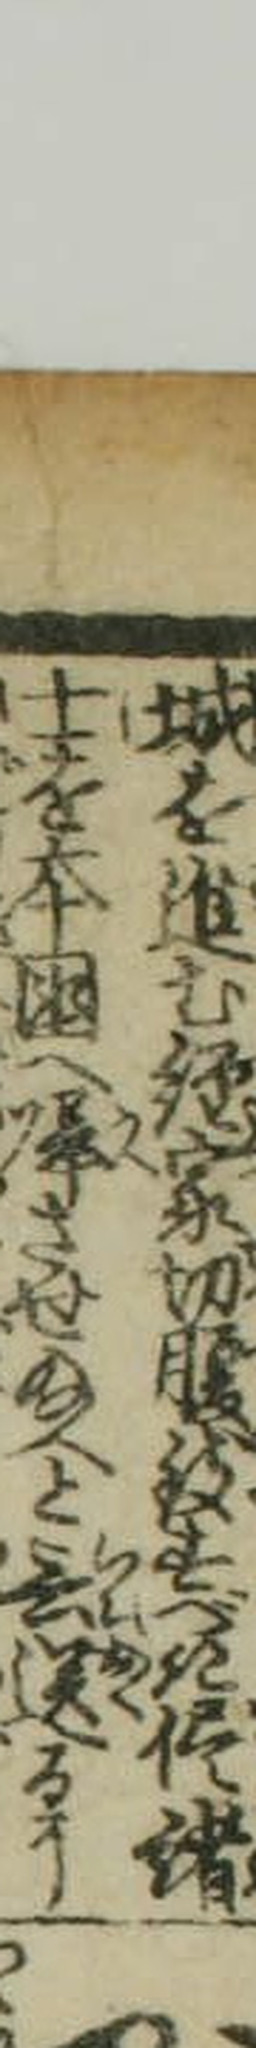士を本国へ帰させ給へと言送るに
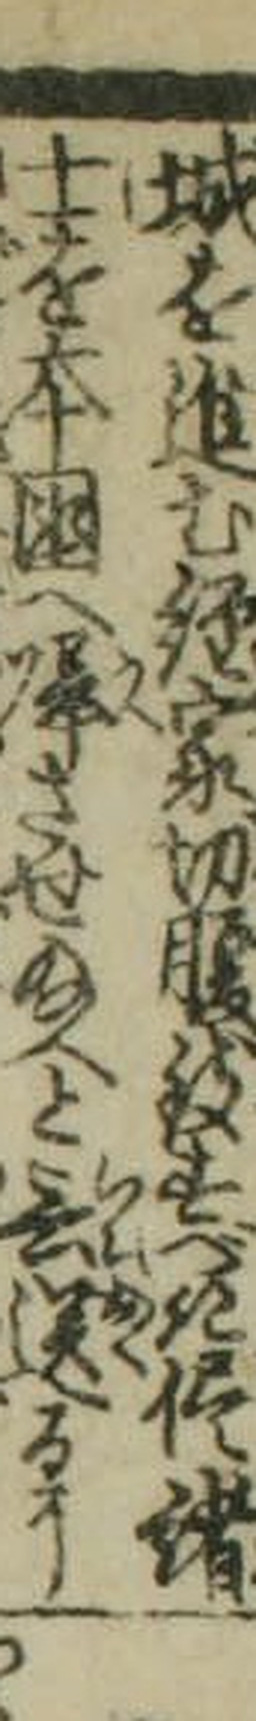士を本国へ帰させ給へと言送るに
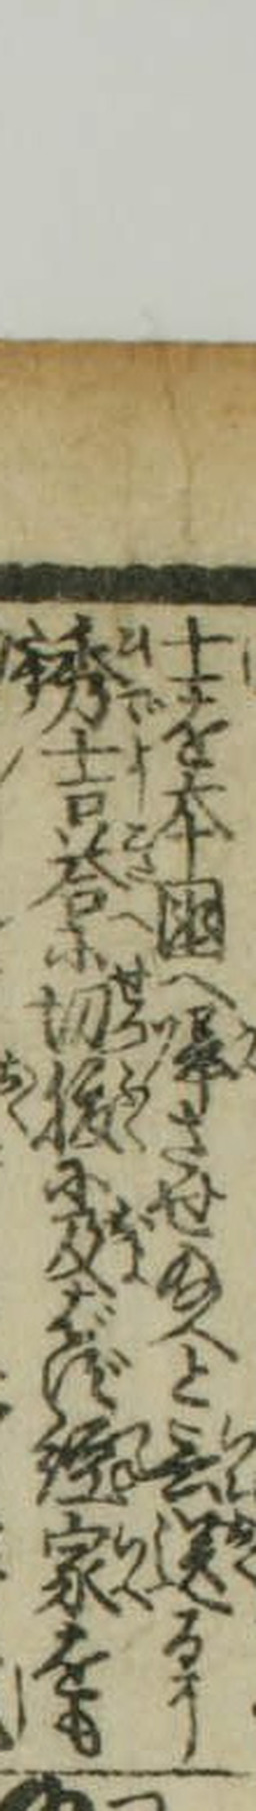秀吉答に切腹に及ばず経家をも
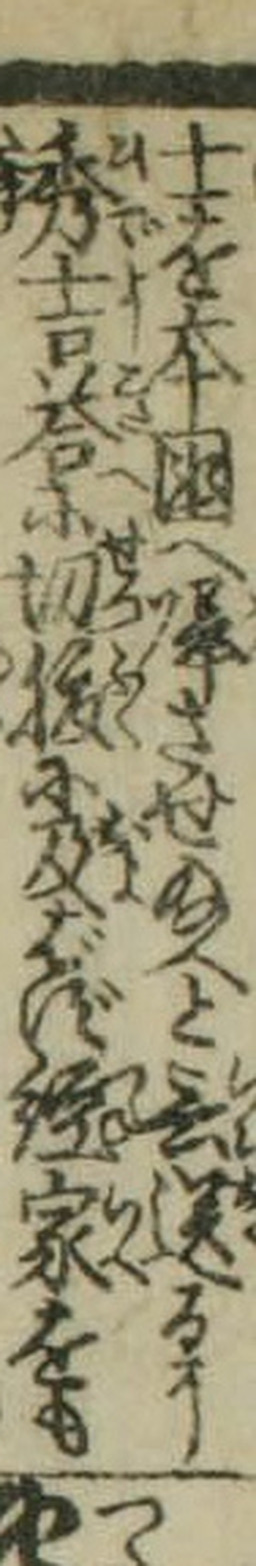秀吉答に切腹に及ばず経家をも
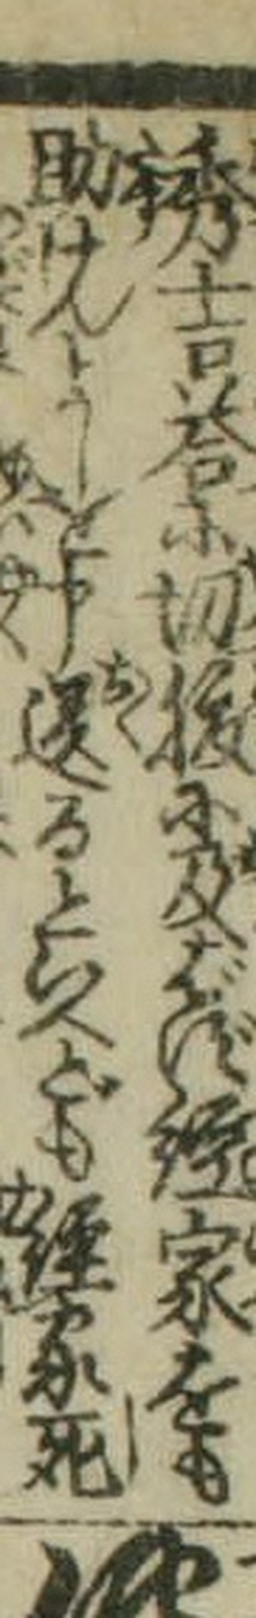助けんよしを申送るといへども経家死
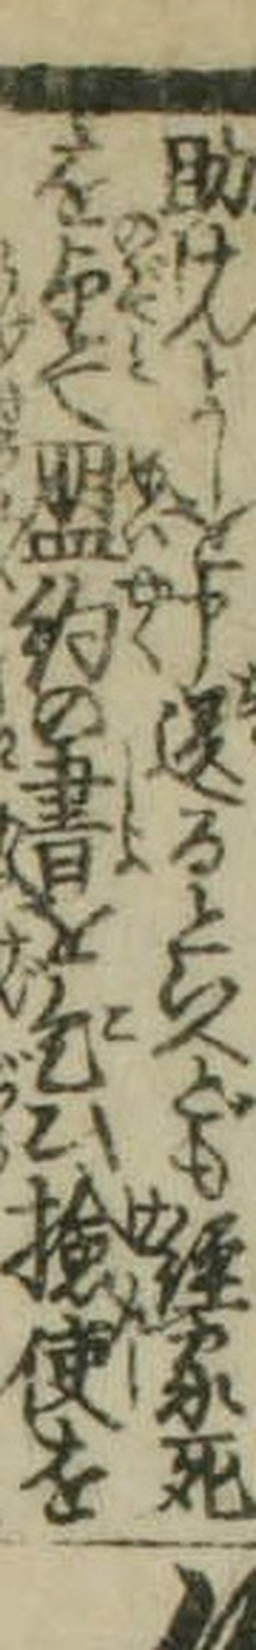を望て盟約の書を乞ひ検使を
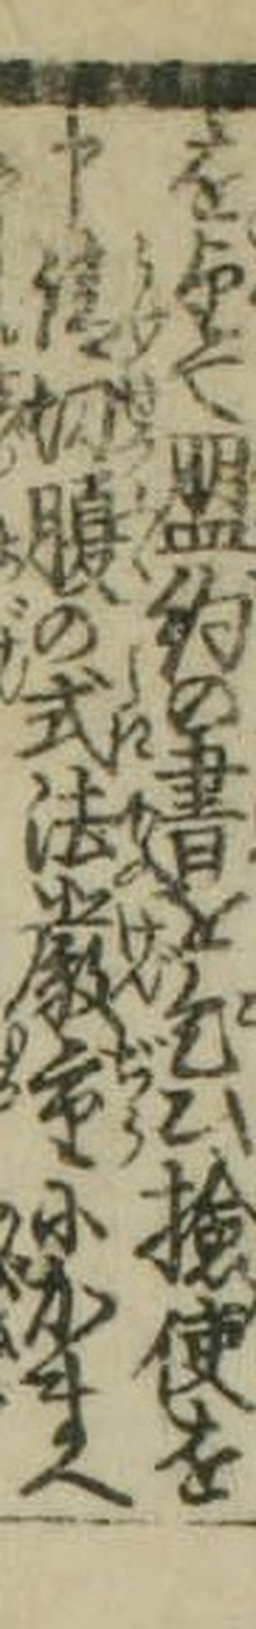申請切腹の式法厳重にかまへ
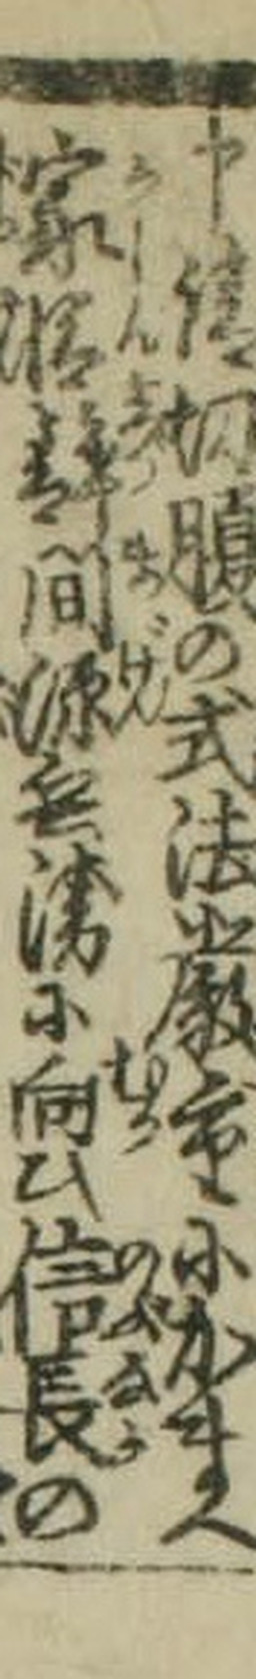家臣静間源兵衛に向ひ信長の
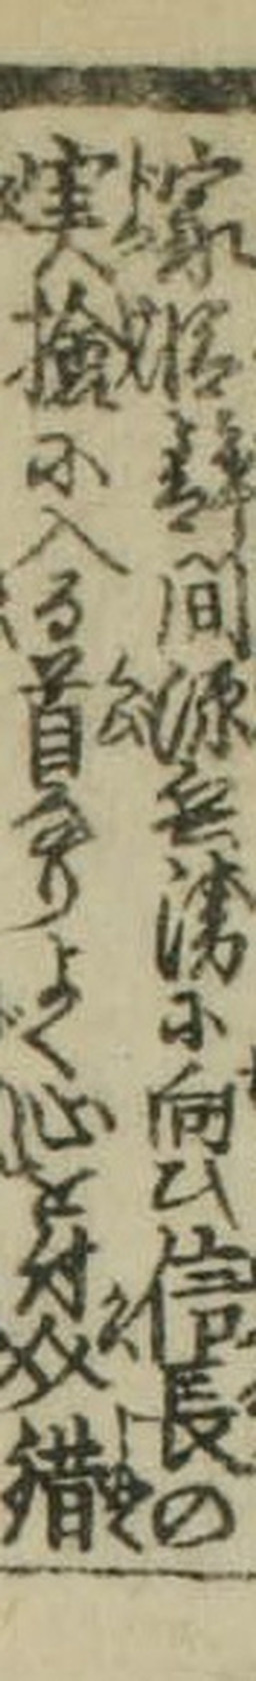実検に入る首なりよく心を付介錯
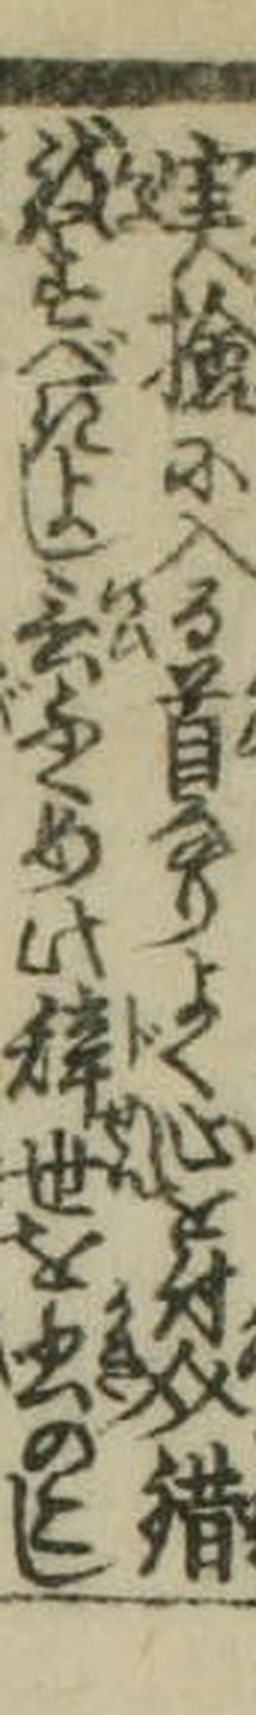致すべきよし言ふくめ此辞世を書のこし
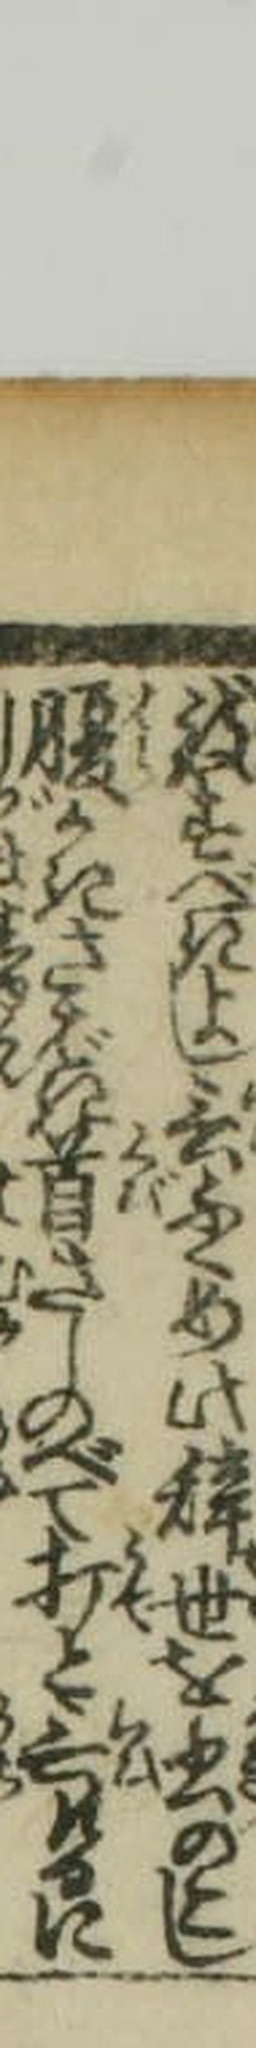腹かきさばき首さしのべて打と言けるに
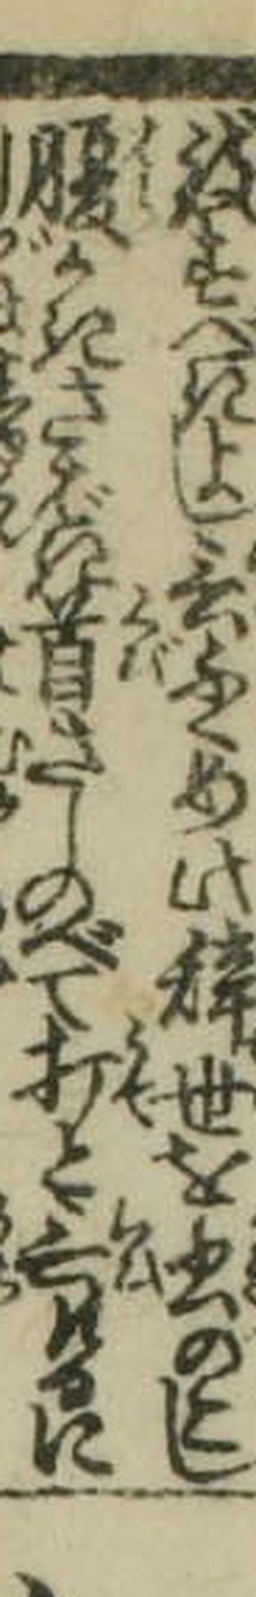腹かきさばき首さしのべて打と言けるに
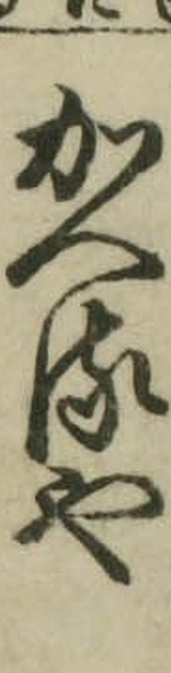かへるや
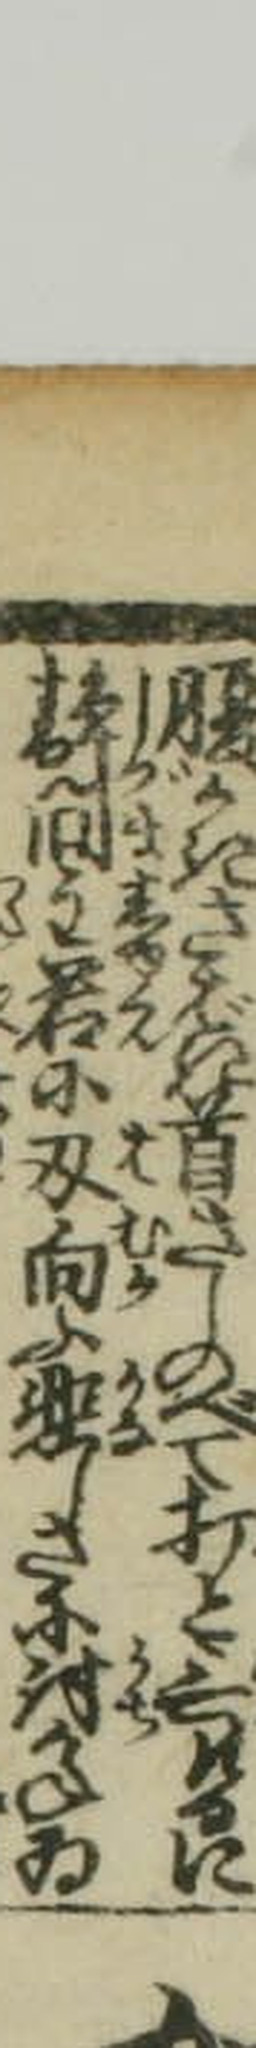静間主君に刃向ふ悲しさに討かねゐ
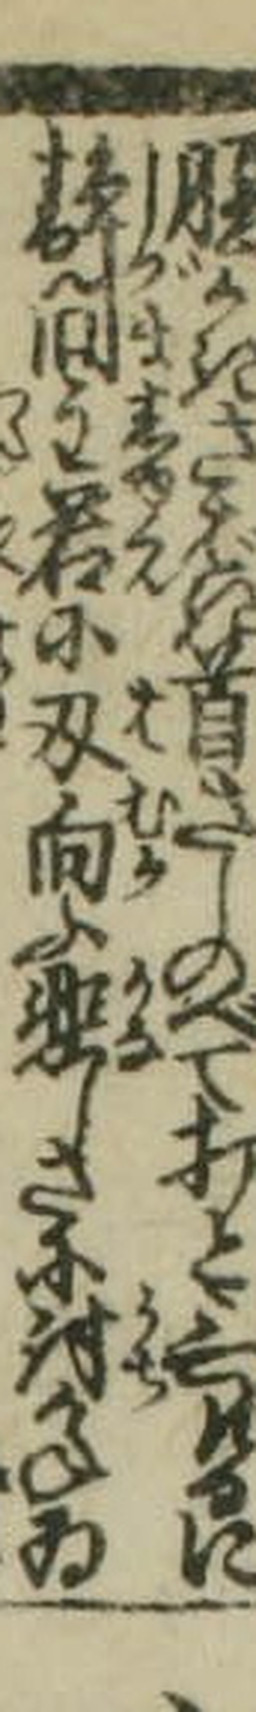静間主君に刃向ふ悲しさに討かねゐ
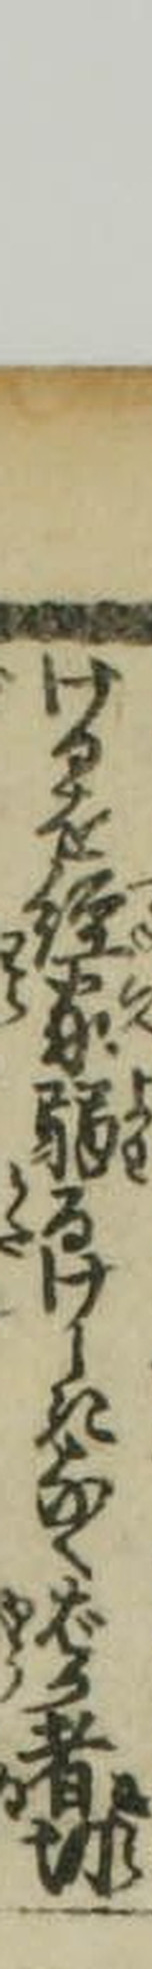けるを経家弱るけしきなくばか者切
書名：續英雄百人一首
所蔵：東京学芸大学附属図書館
